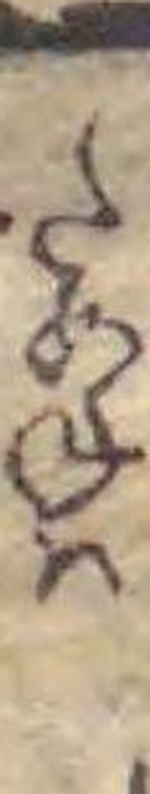ためには
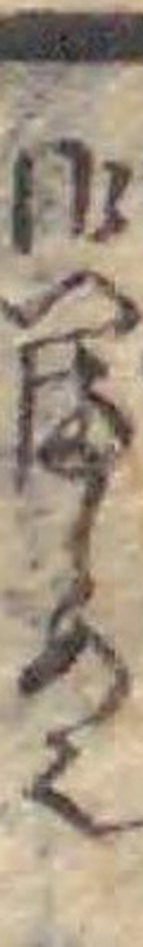御いましめ也
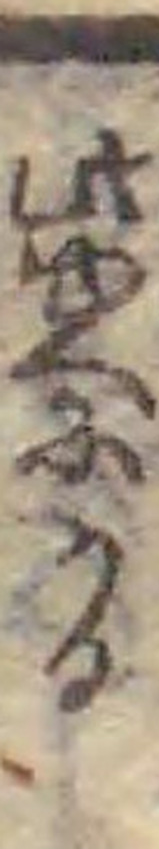此ゆへにかる
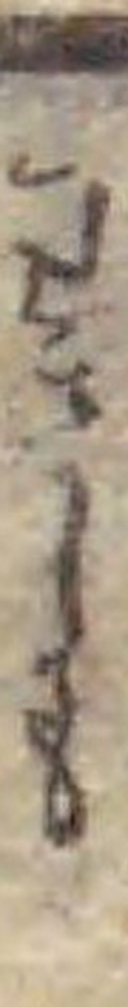わさしも
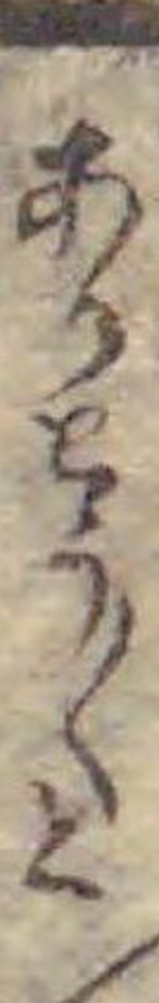ありとう〳〵と
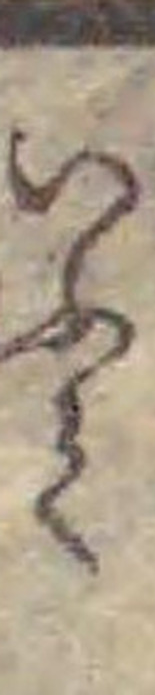いふて
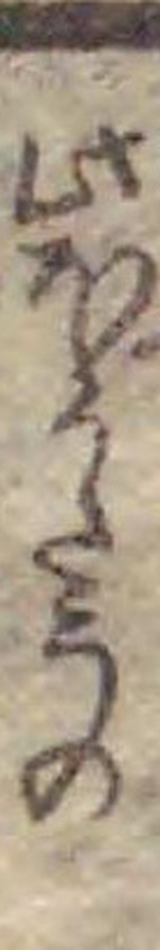此ほうたうの
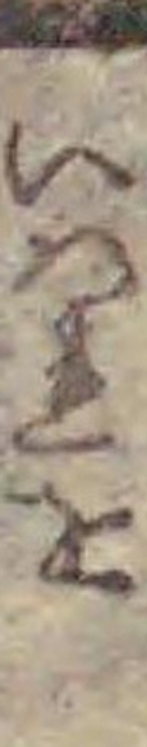いはれを
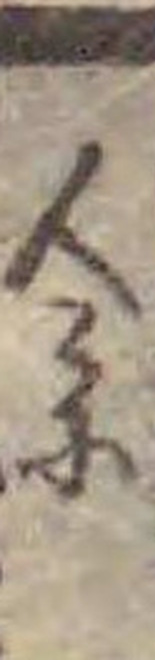人々に

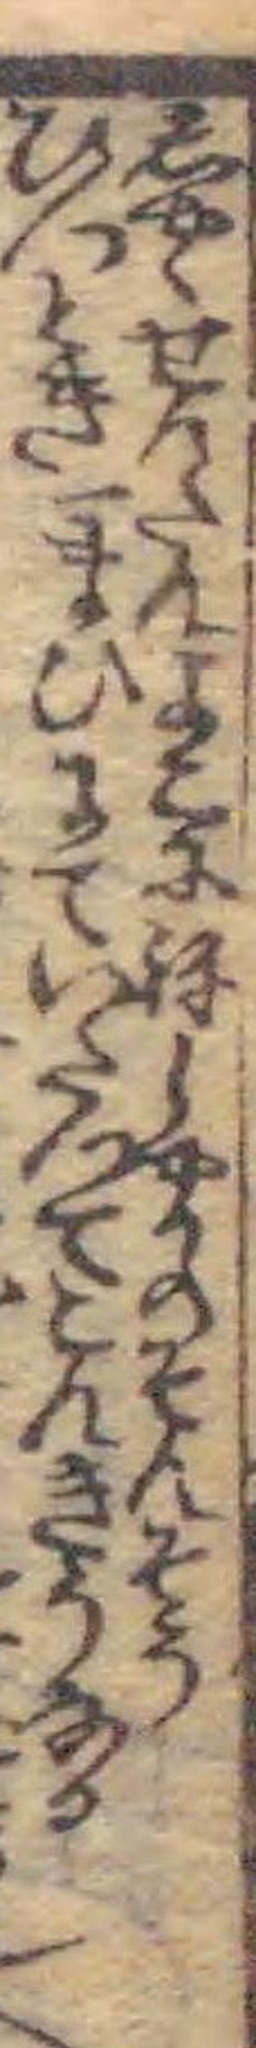ひつとき一まひにていたつてこんきうなる
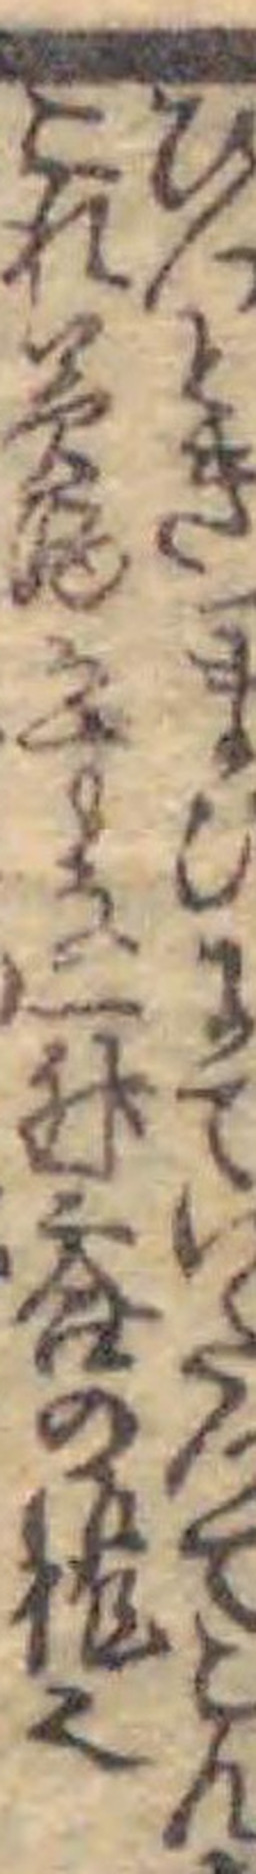これ美酒かすな一升三合の御作也
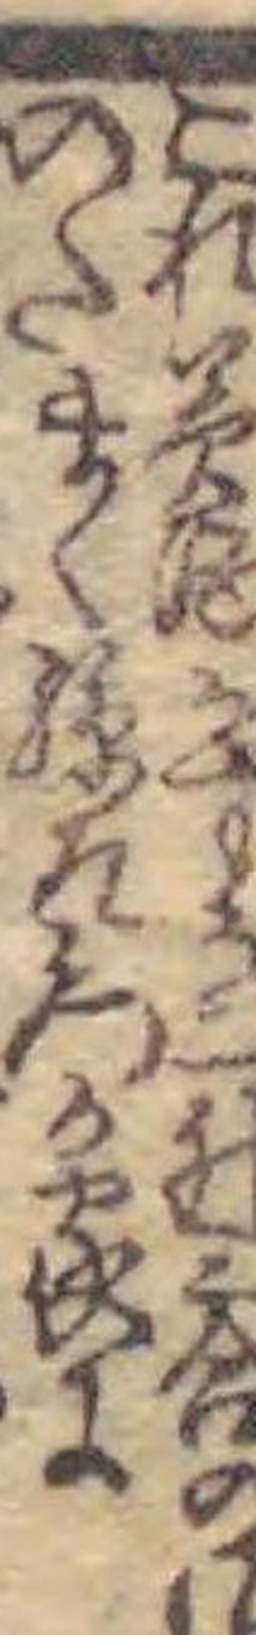のたまく孫左衛門か家に
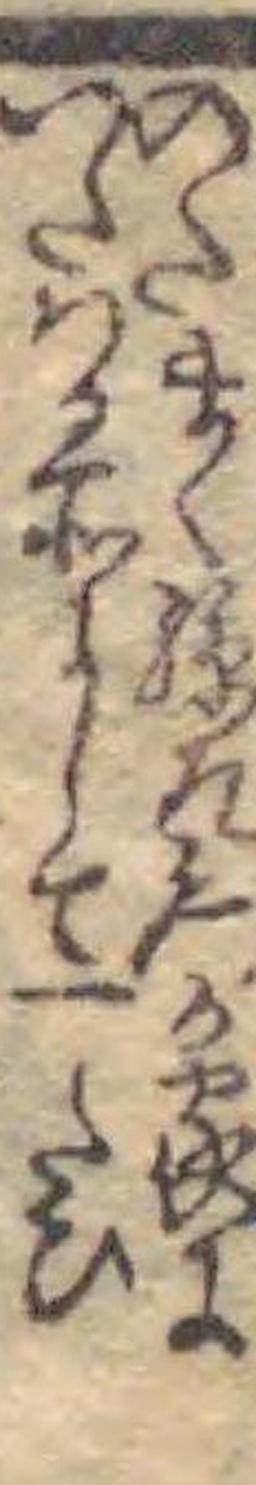つたはる所にして一たひ
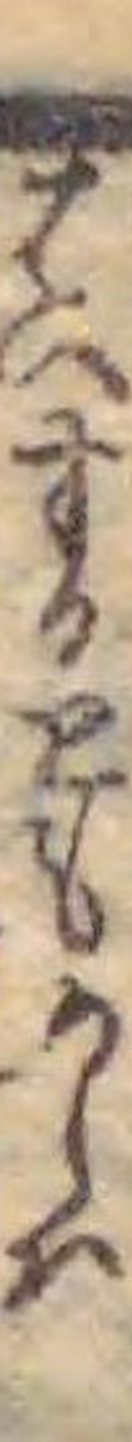はいするともからは
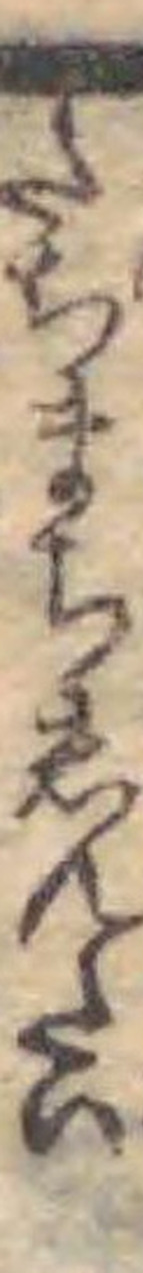たちまちしんたい
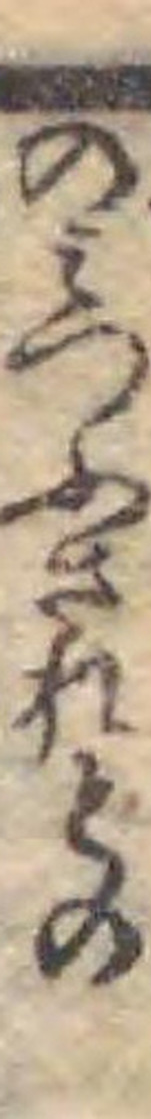のみつふされとの
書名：身体開帳略縁起 : 3巻
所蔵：国立国会図書館 National Diet Library, JAPAN
